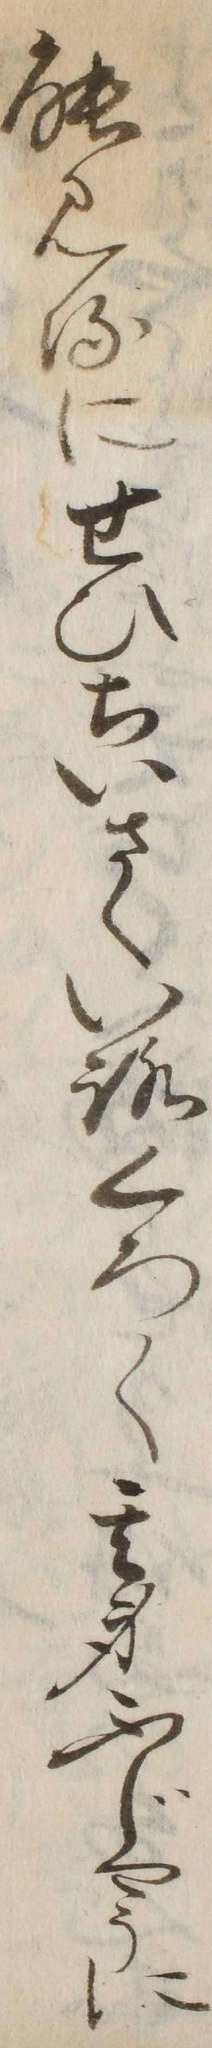能見るにせひちいさくいろくろく其身ふじやうに
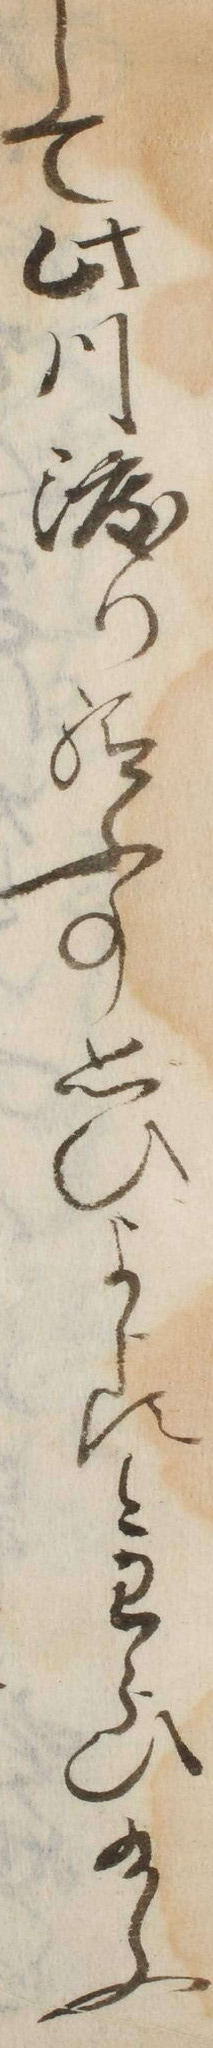して此川渡り給ふ事思ひよらすとわらひ給ふ
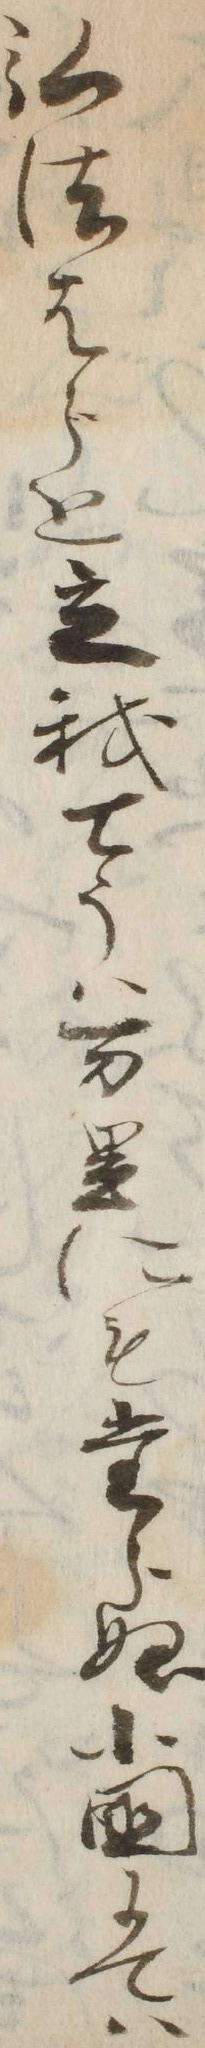弘法はらを立我てうは万里にもたらぬ小国にては
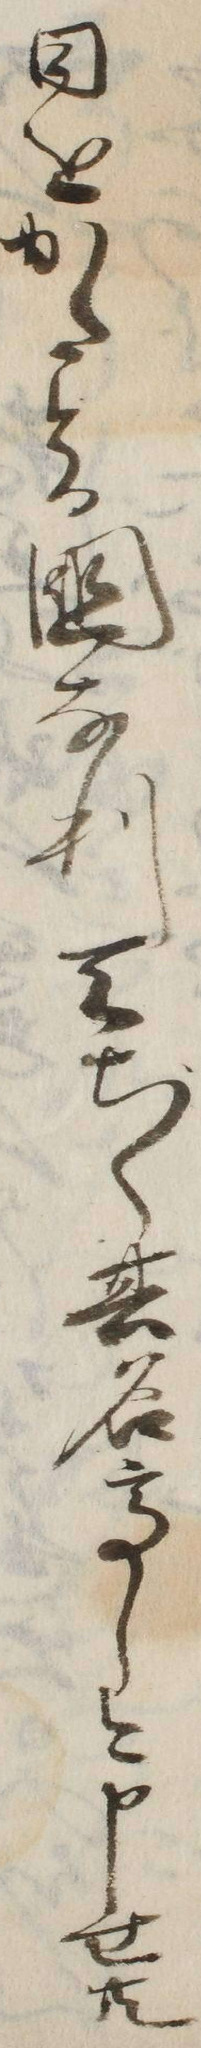日をかたとる国なり天ちく其名高しと申せ共
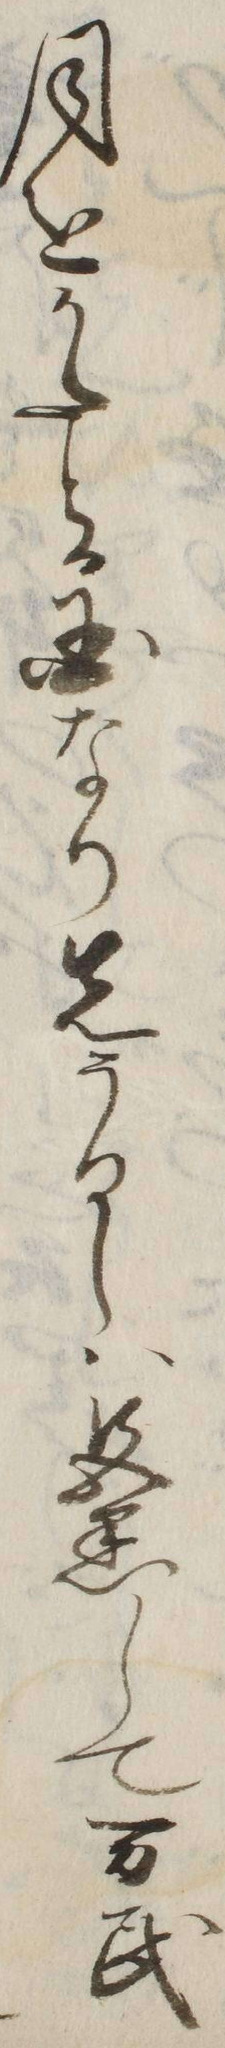月をかたとか国なり先うるしは色黒して万民
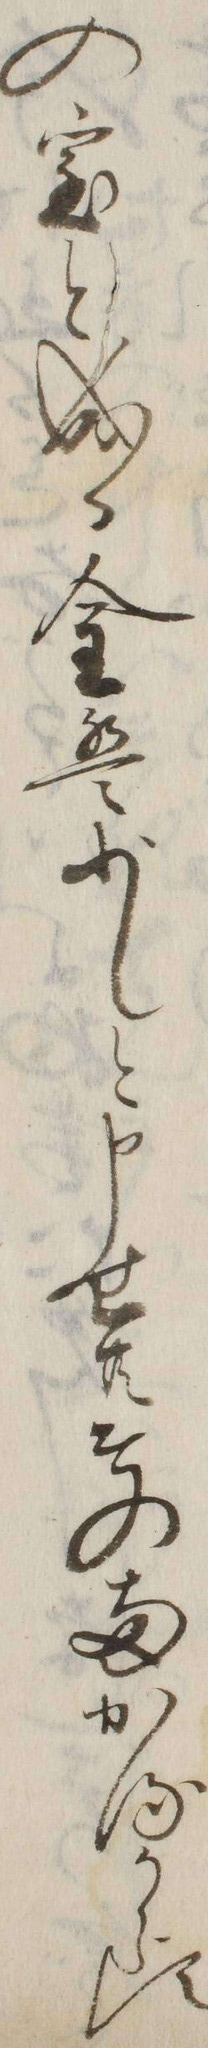の宝と成る金は少しと申せ共その両かるかるからす
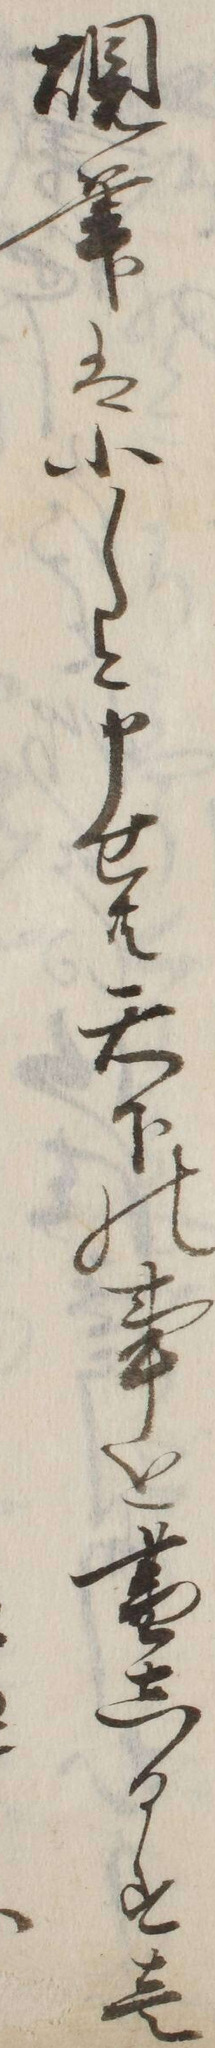硯筆は小しと申せ共天下の事を書しるも壱
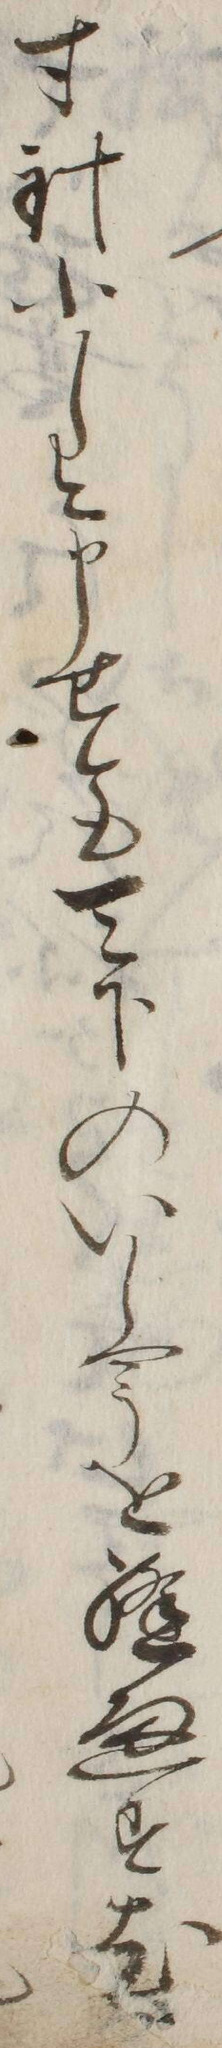寸針小しと申せも天下のいしやうを縫通す尤
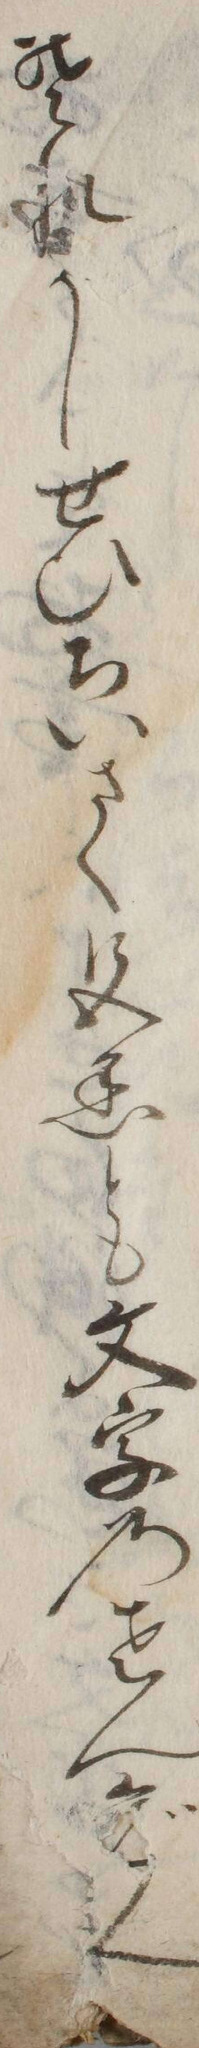それかしせひちいたく色黒とも文字のせん

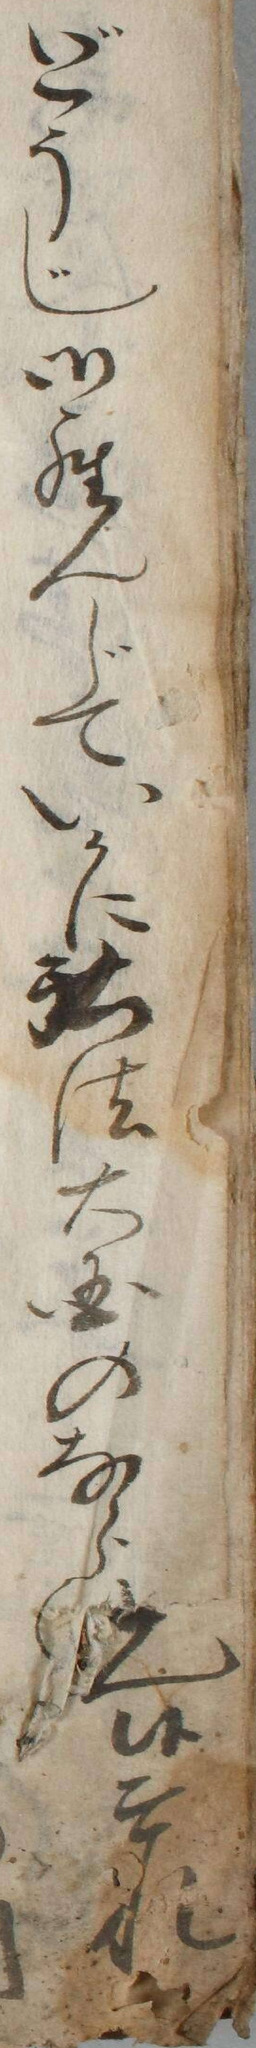どうじ御覧んじていかに弘法大国のならひ……
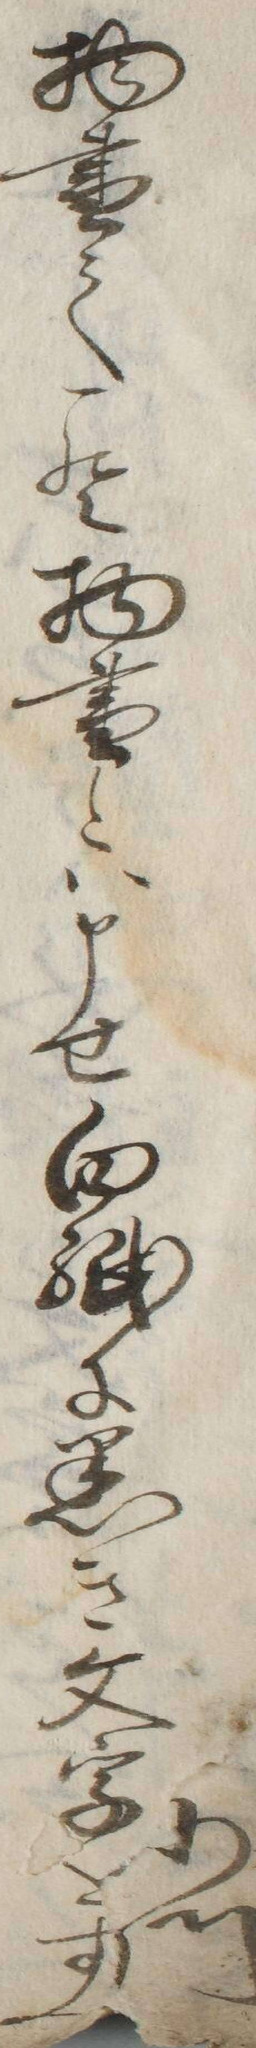物書てこそ物書とは申せ白紙に黒き文字をすへ
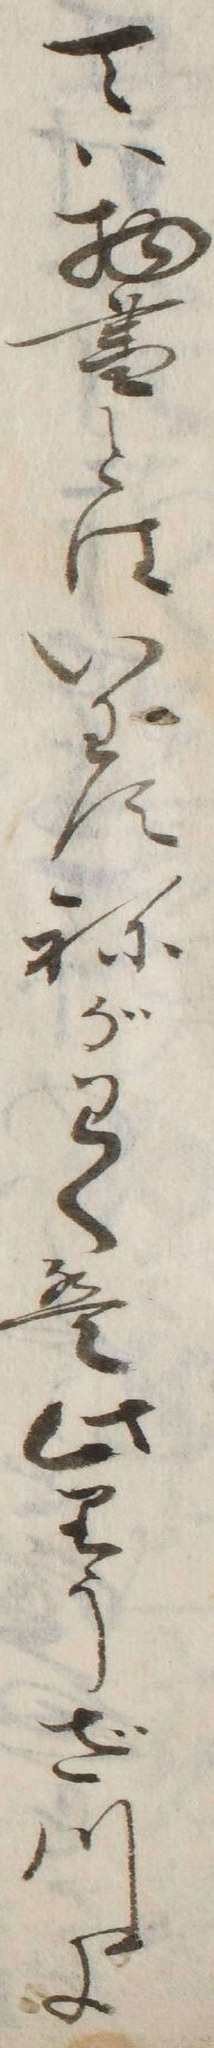ては物書とはいわすねがわくは此りうざ川に
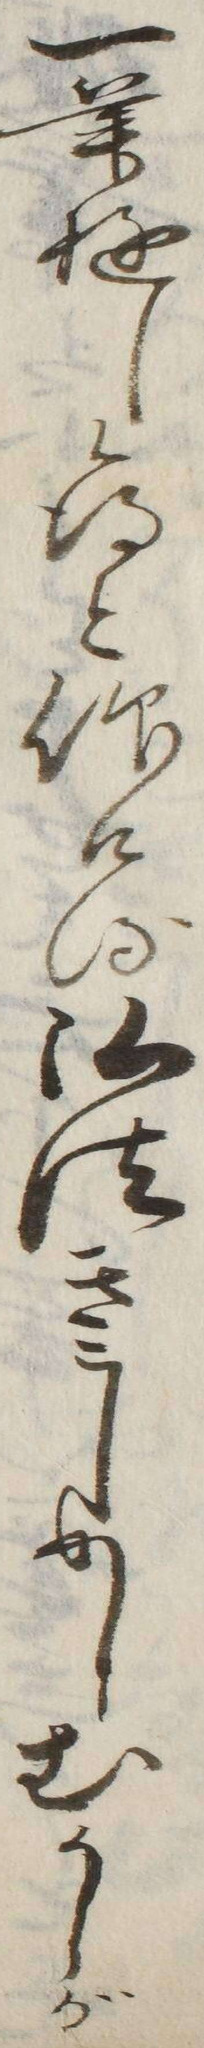一筆遊し候得と仰ける弘法きこしめしむかしが
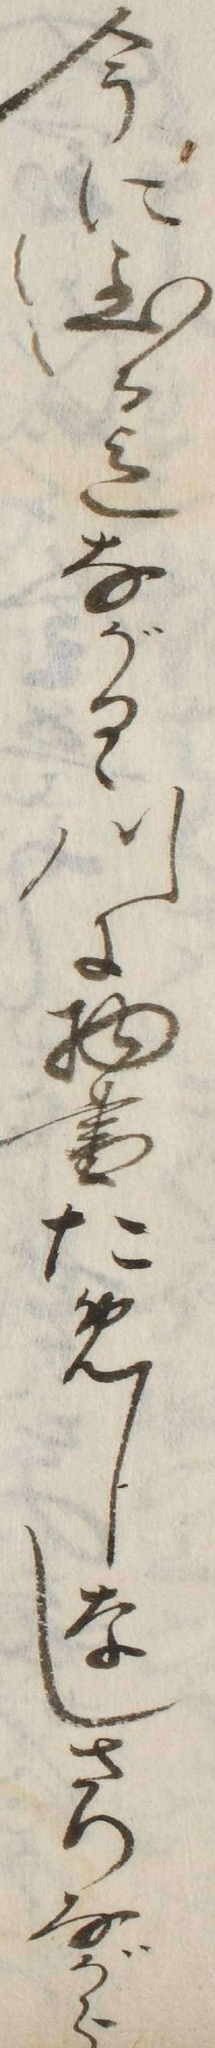今に至る迄ながるゝ川に物書ためしなしさりながら
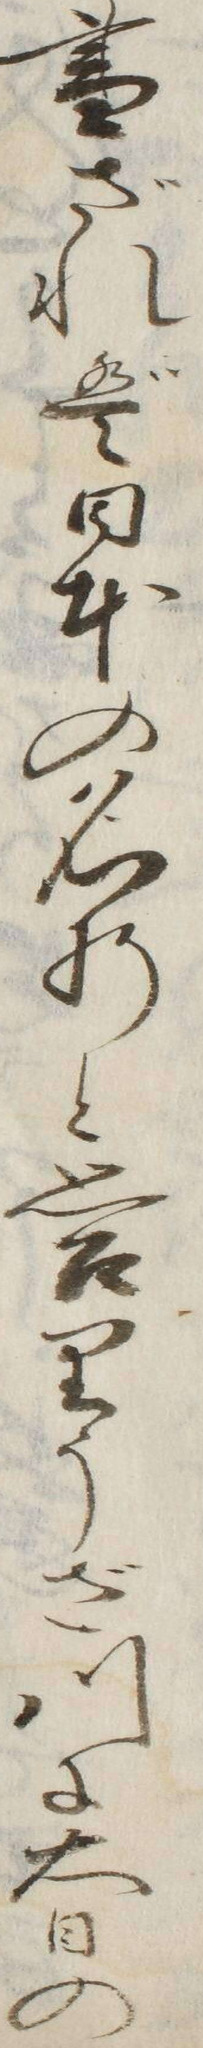書ざれば日本の名折と答りうざ川に大日の
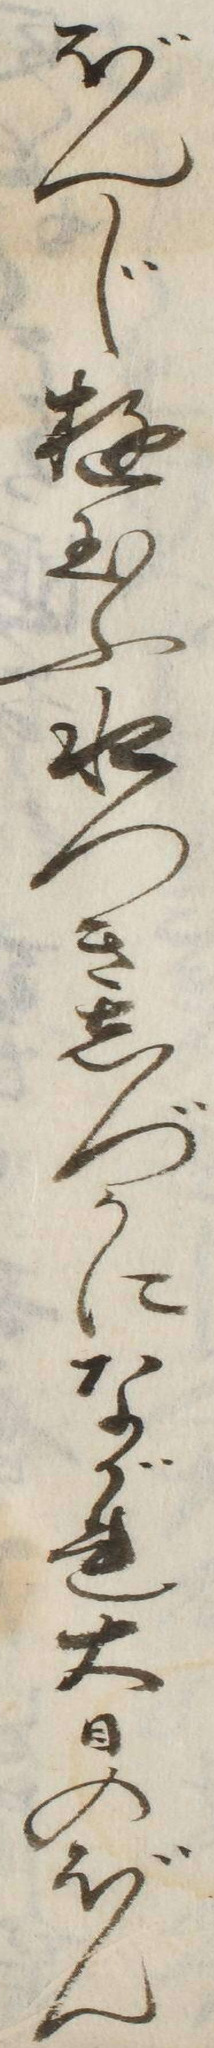ぼんじ遊玉ふ水つきしづかにながれ大日のぼん
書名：奉弘法大師御傳記
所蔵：国文学研究資料館
